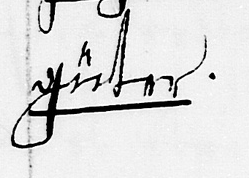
güter.
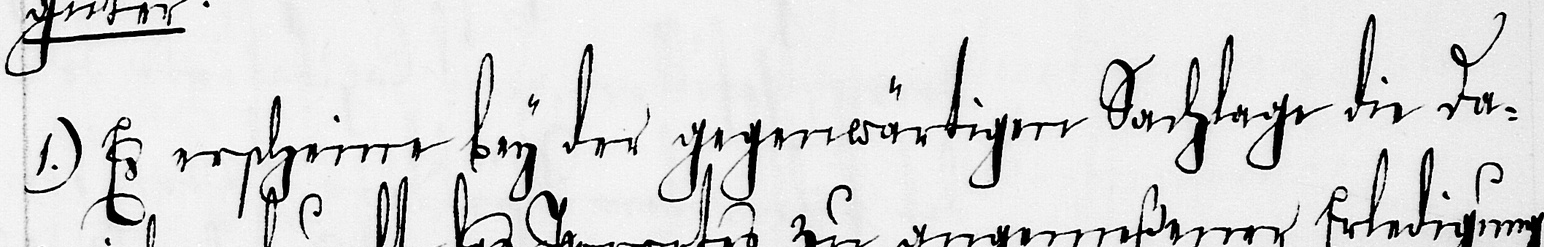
1.) Es erscheine bey der gegenwärtigen Sachlage die Da¬
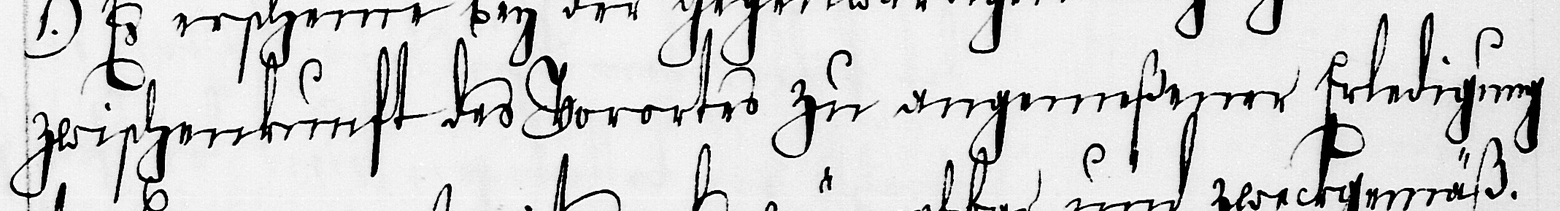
zwischenkunft des Vorortes zu angemeßener Erledigung
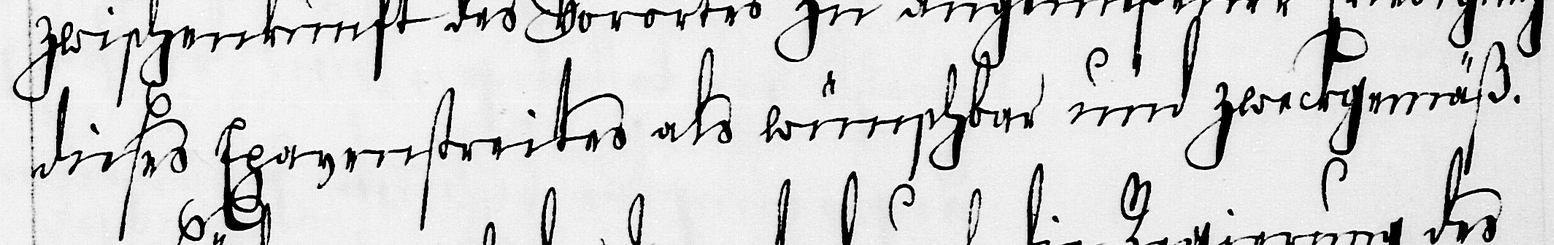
dieses Epavenstreites als wünschbar und zweckgemäß.
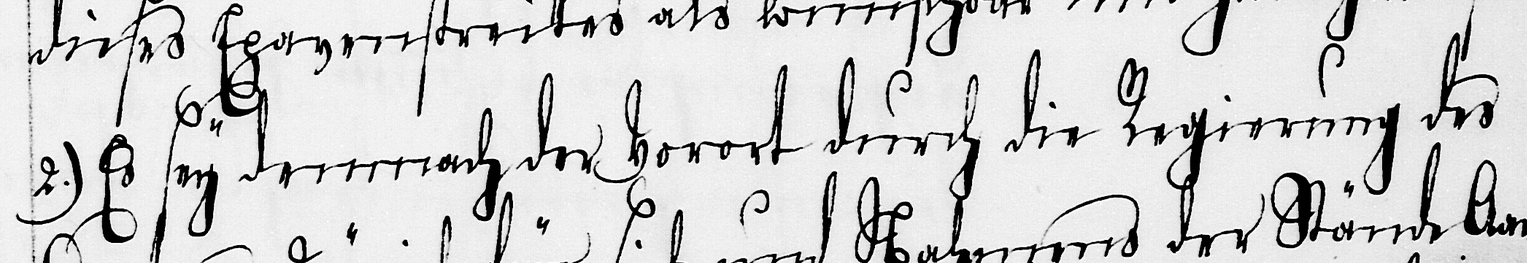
2.) Es sey demnach der Vorort durch die Regierung des
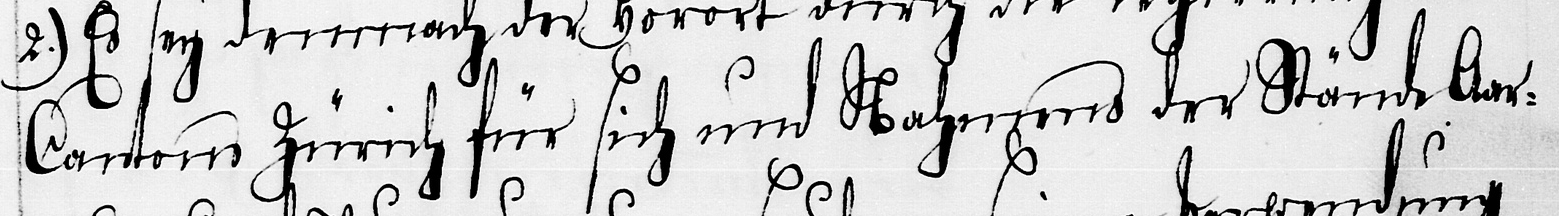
Cantons Zürich für sich und Nahmens der Stände Aar¬
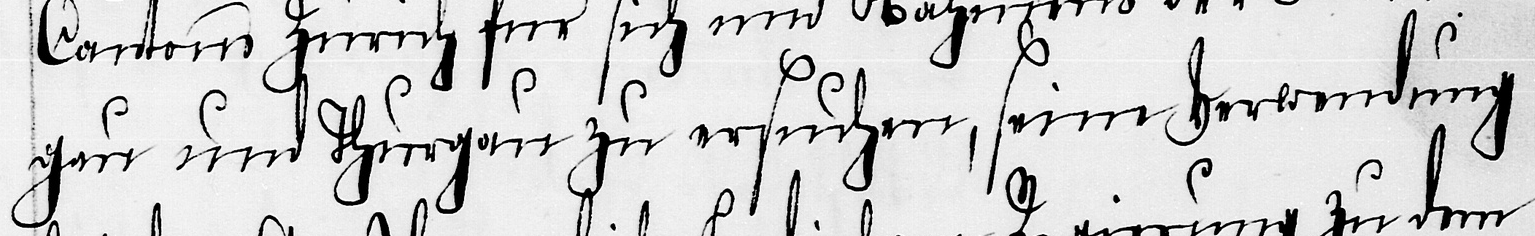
gau und Thurgau zu ersuchen, seine Verwendung
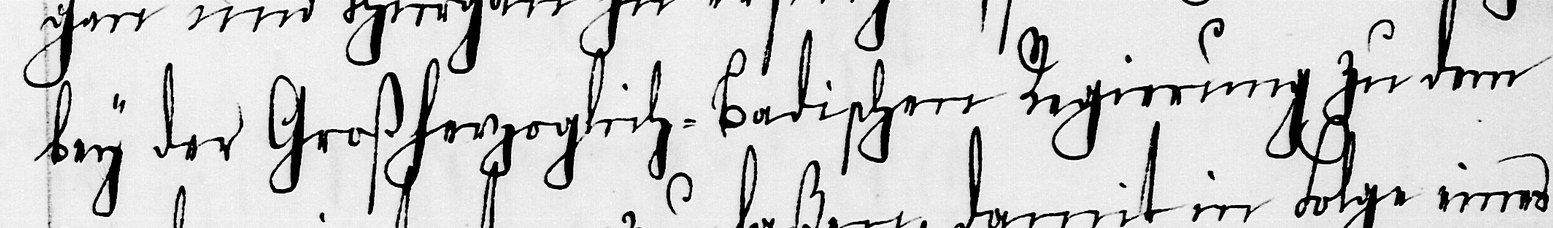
bey der Großherzoglich-Badischen Regierung zu dem
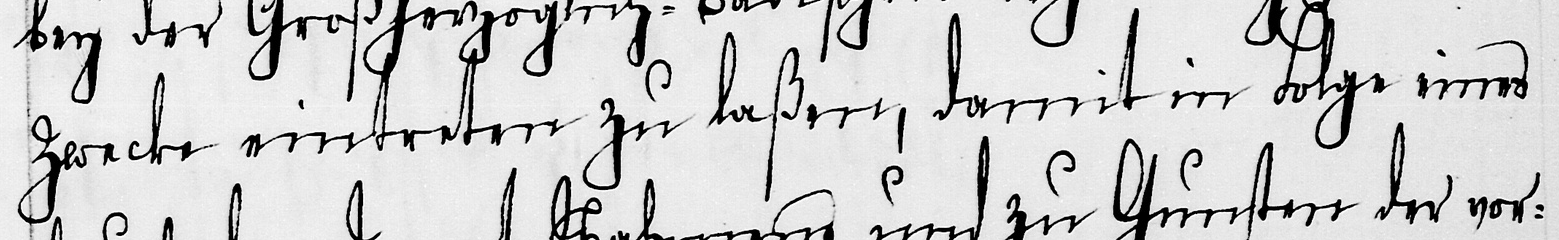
Zwecke eintreten zu laßen, damit in Folge eines
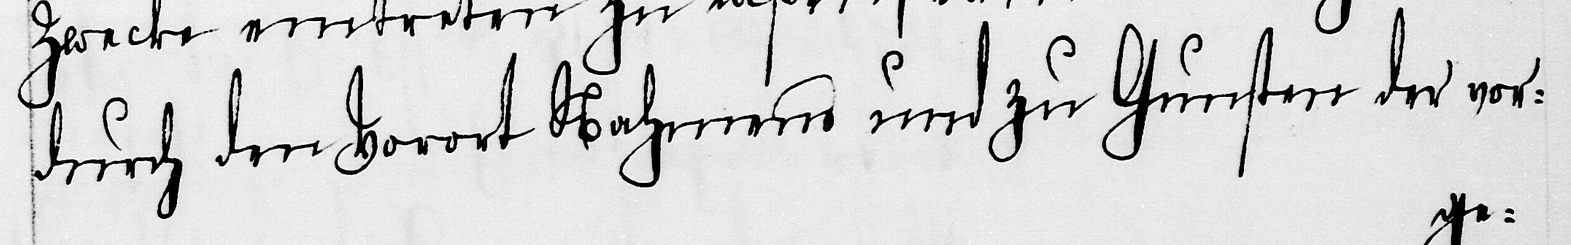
durch den Vorort Nahmens und zu Gunsten der vor-
